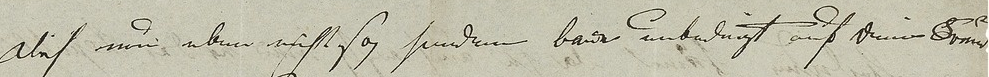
dich nun eben nicht so, sondern baue unbedingt auf deine Freund-
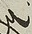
deinem
